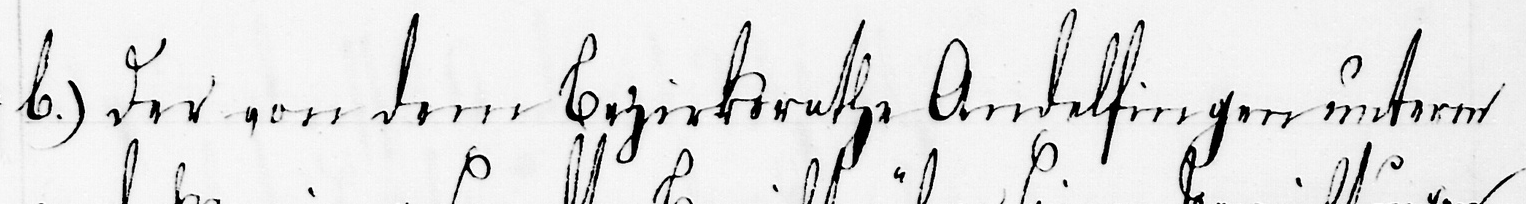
b.) Der von dem Bezirksrathe Andelfingen unterm
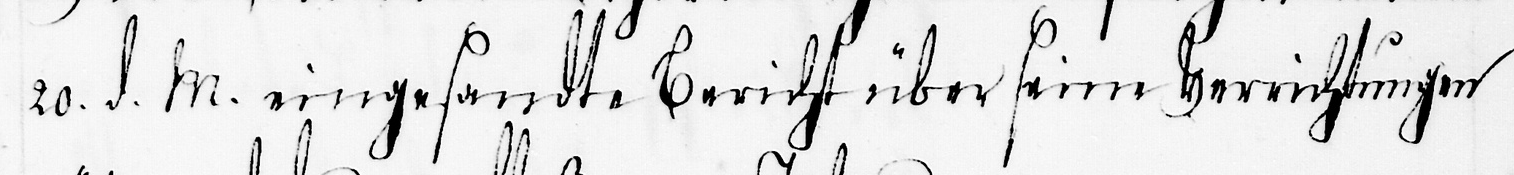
20. d. M. eingesandte Bericht über seine Verrichtungen
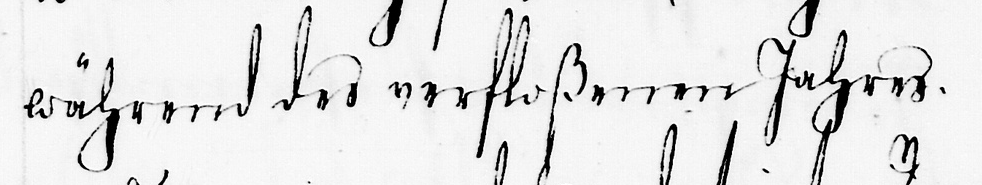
während des verfloßenen Jahres.
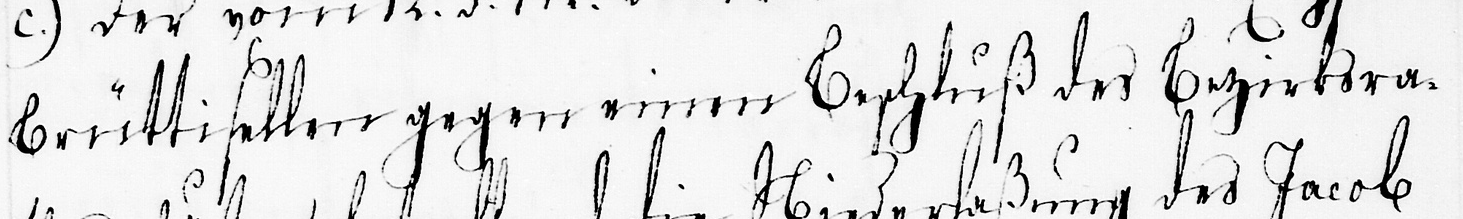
Brüttisellen gegen einen Beschluß des Bezirksra¬
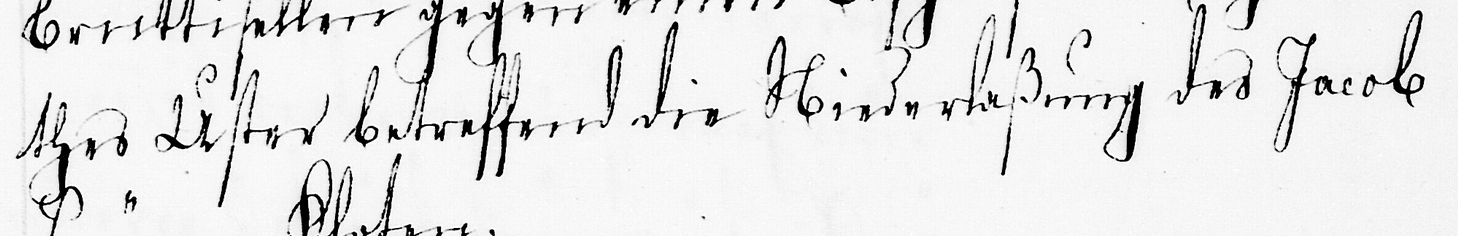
thes Uster betreffend die Niederlaßung des Jacob
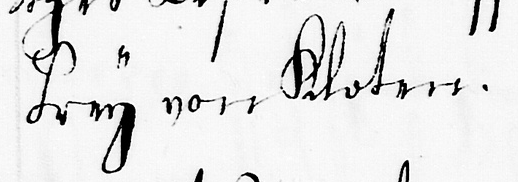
Frey von Kloten.
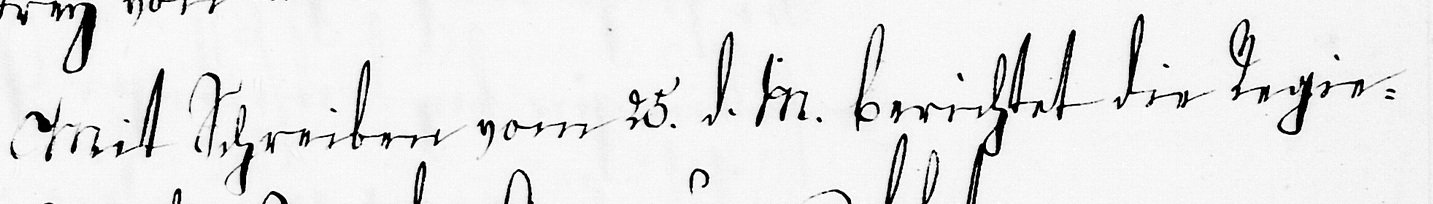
Mit Schreiben vom 25. d. M. berichtet die Regie¬
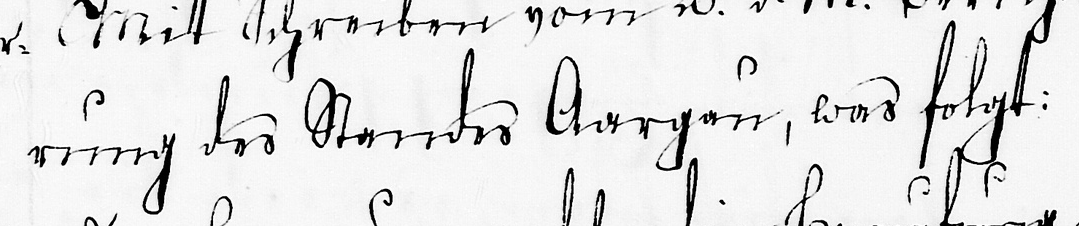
rung des Standes Aargau, was folgt:
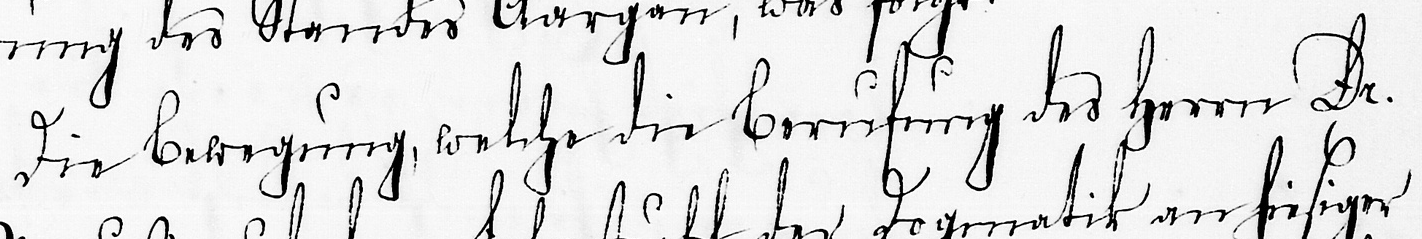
Die Bewegung, welche die Berufung des Herrn Dr.
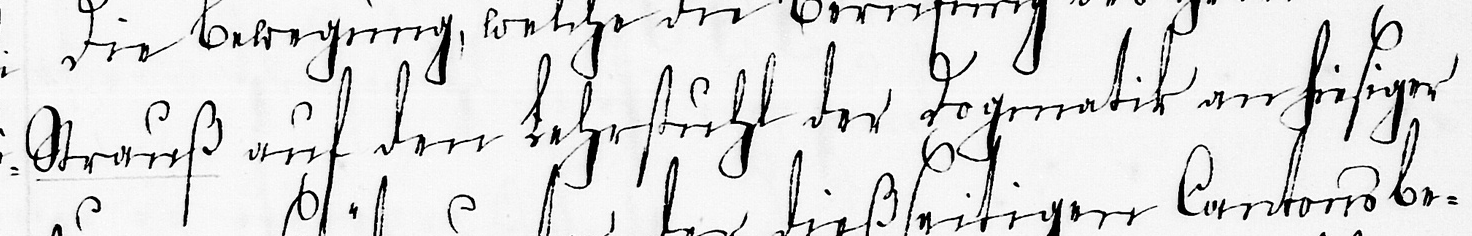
Strauß auf den Lehrstuhl der Dogmatik an hiesiger
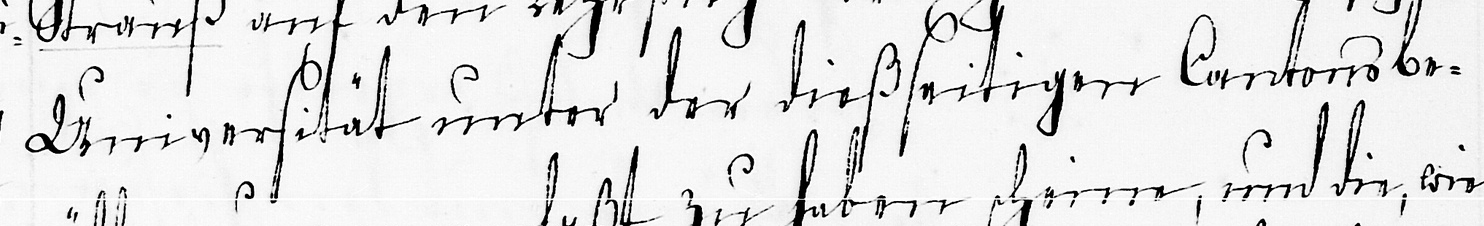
Universität unter der dießseitigen Cantonsbe¬
